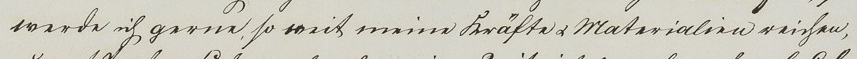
werde ich gerne, so weit meine Kräfte & Materialien reichen,
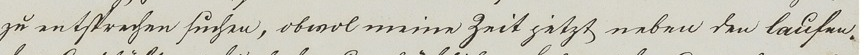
zu entsprechen suchen, obwol meine Zeit jetzt, neben den laufen-
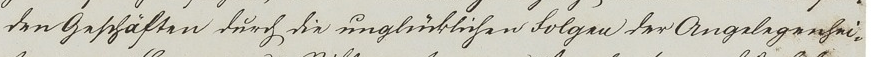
den Geschäften durch die unglücklichen Folgen der Angelegenhei-
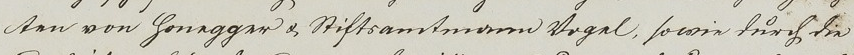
ten von Honegger & Stiftsamtmann Vogel, sowie durch die
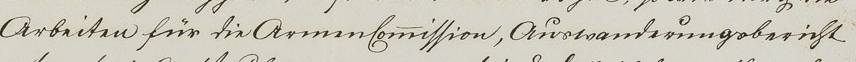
Arbeiten für die Armen Commission, Auswanderungsbericht
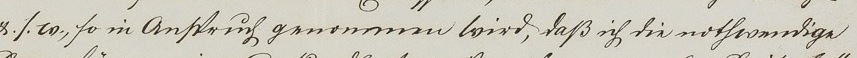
u. s. w., so in Anspruch genommen wird, daß ich die nothwendige
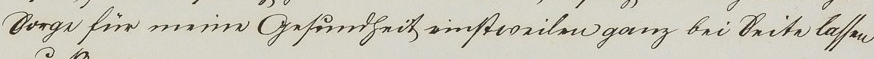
Sorge für meine Gesundheit einstweilen ganz bei Seite lassen
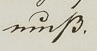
muß.
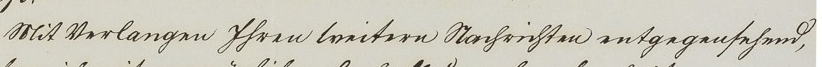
Mit Verlangen Ihren weitern Nachrichten entgegensehend,
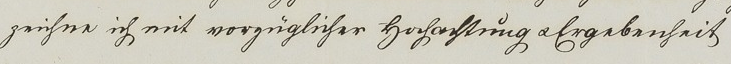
zeichne ich mit vorzüglicher Hochachtung & Ergebenheit
